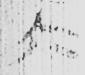六
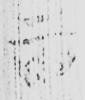百
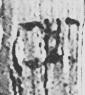五
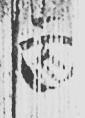百
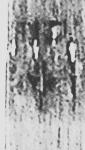{四十}
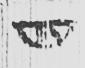四
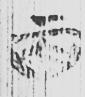百
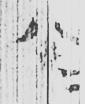八十=
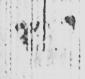四
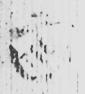百
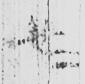廿=
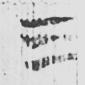三
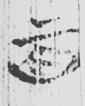百
